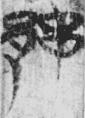○（呂）
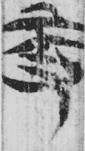○（辨）
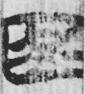爲
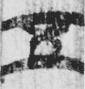五
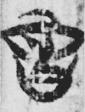音
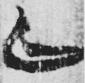㠯（以）
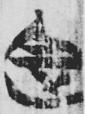定
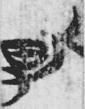男
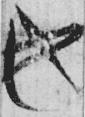女
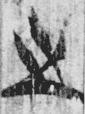之
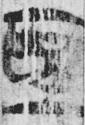聖（聲）
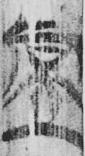○（當）
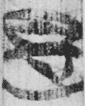是
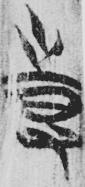時
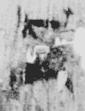也
